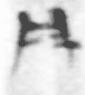凡
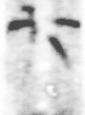大（太）
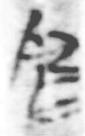官
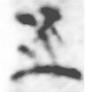之
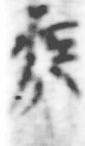馬
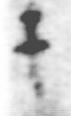十
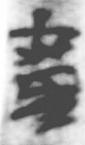𨍱（乘）
